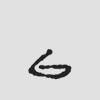㠯（以）
